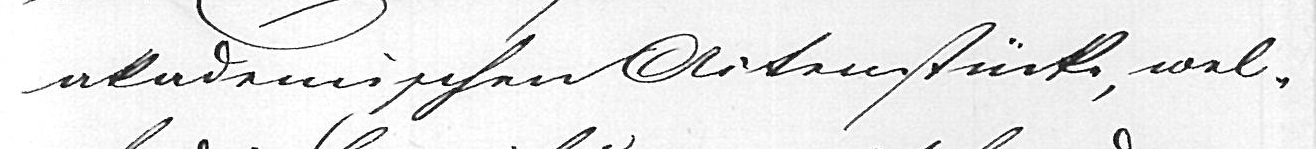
akademischen Actenstücke wel-
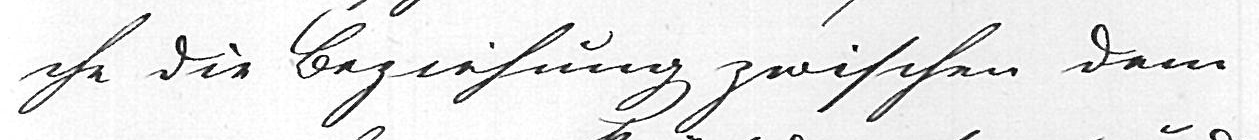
che die Beziehung zwischen dem
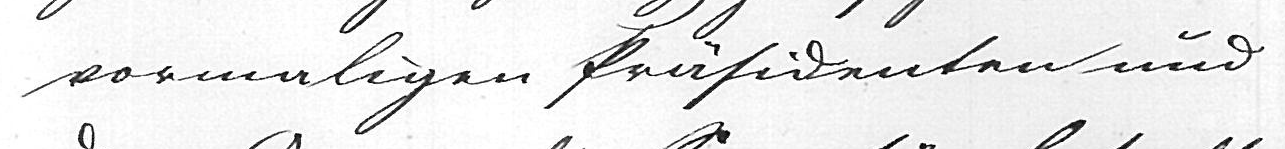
vormaligen Präsidenten und
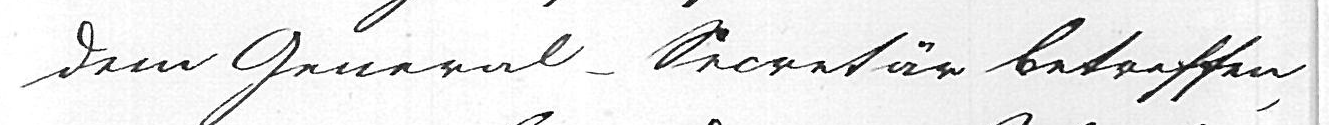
dem General-Secretär betreffen,
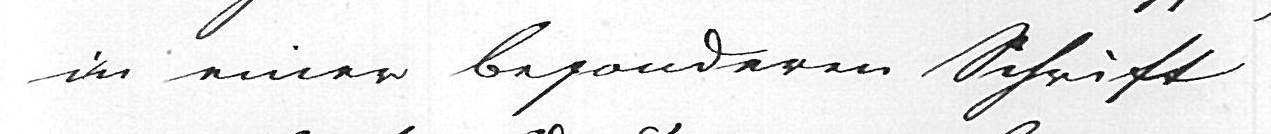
in einer besonderen Schrift
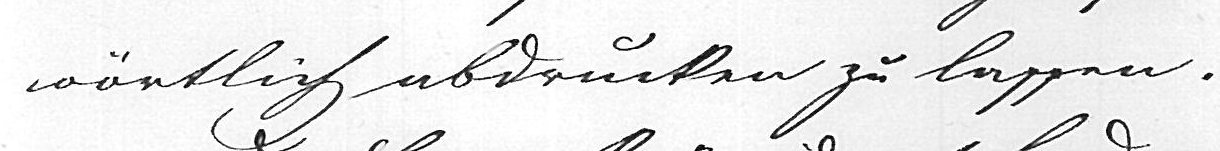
wörtlich abdrucken zu lassen.
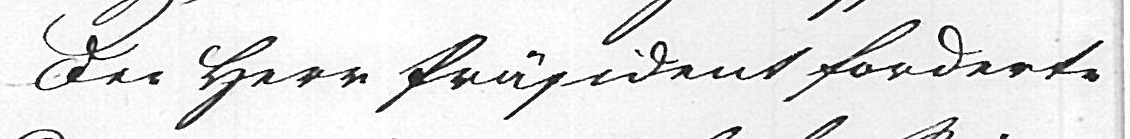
Der Herr Präsident fordert
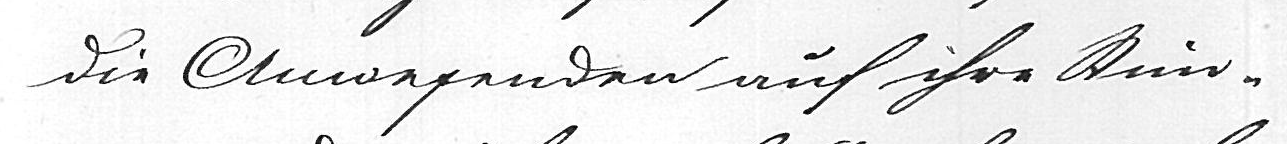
die Anwesenden auf ihre Stim-
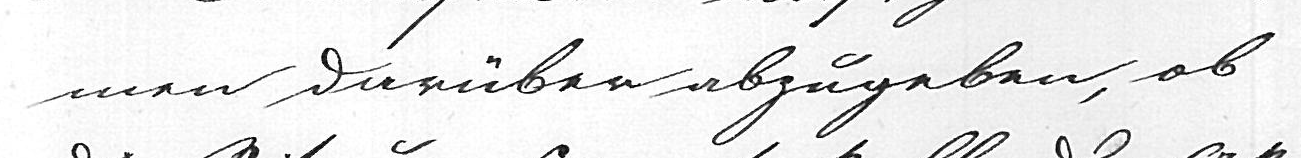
men darüber abzugeben, ob
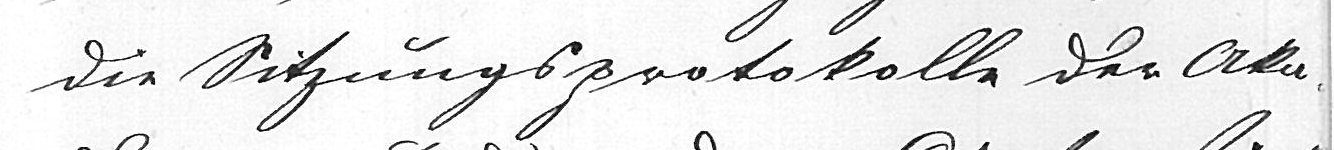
die Sitzungsprotokolle der Aka-
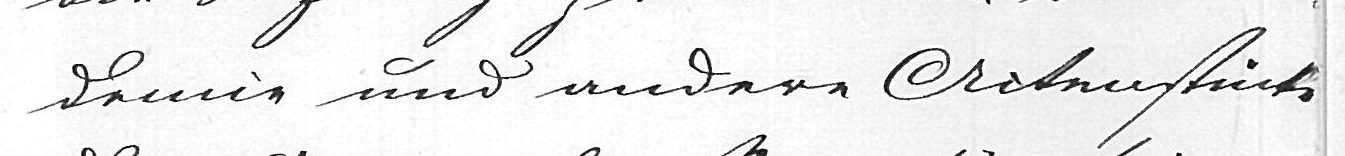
demie und andere Actenstücke
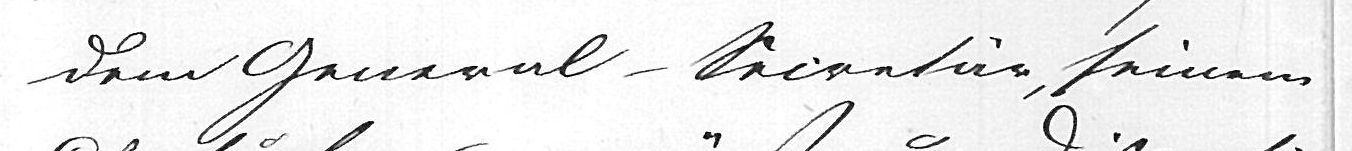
dem General-Secretär, seinem
